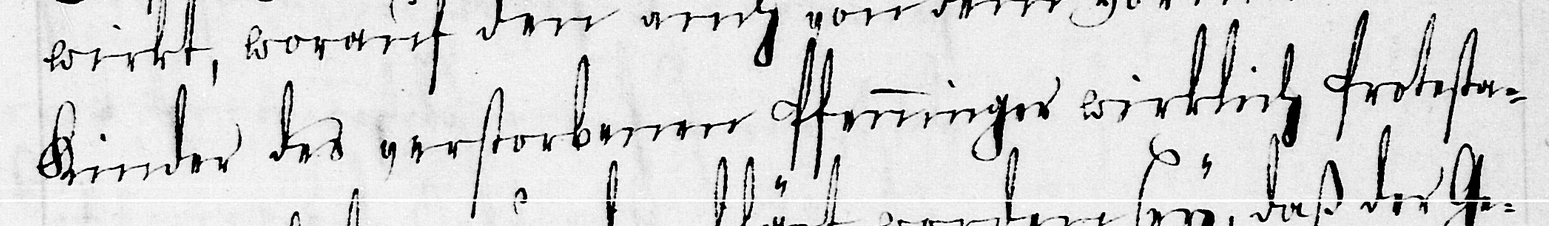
Kinder des verstorbenen Pfenninger wirklich Protesta¬
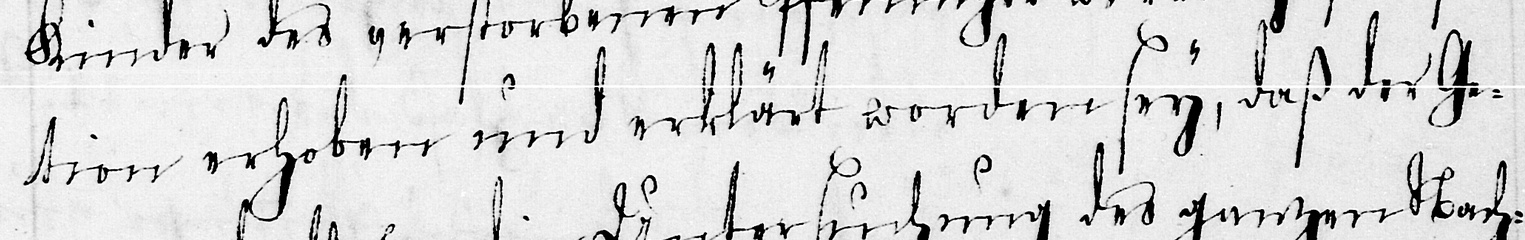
tion erhoben und erklärt worden sey, daß der Ge¬
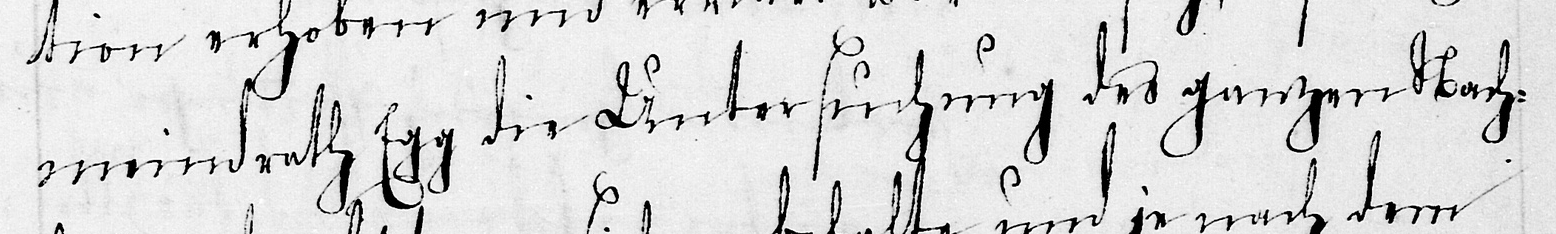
meindrath Egg die Untersuchung des ganzen Nach¬
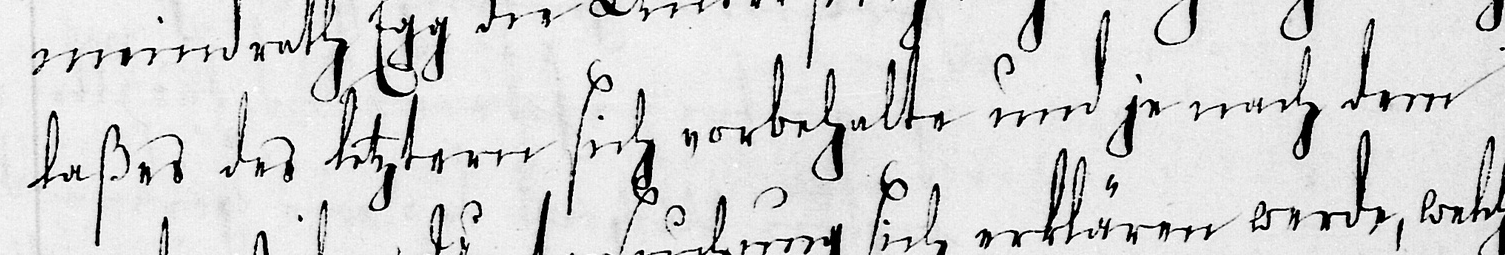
laßes des letztern sich vorbehalte und je nach dem
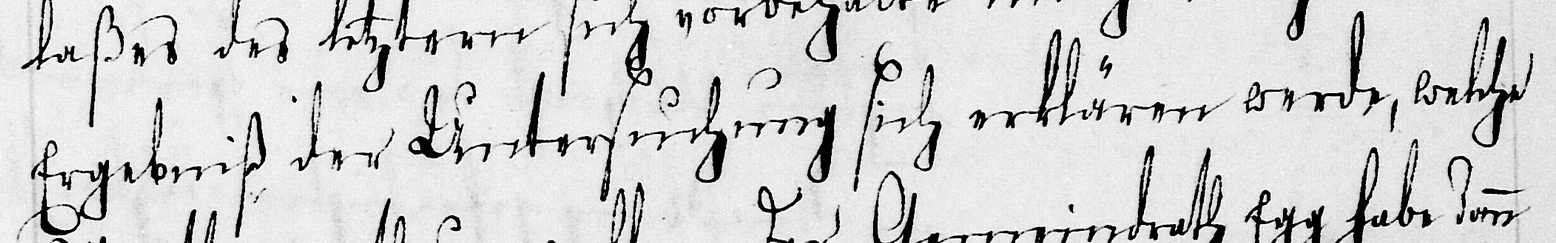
Ergebniß der Untersuchung sich erklären werde, welche
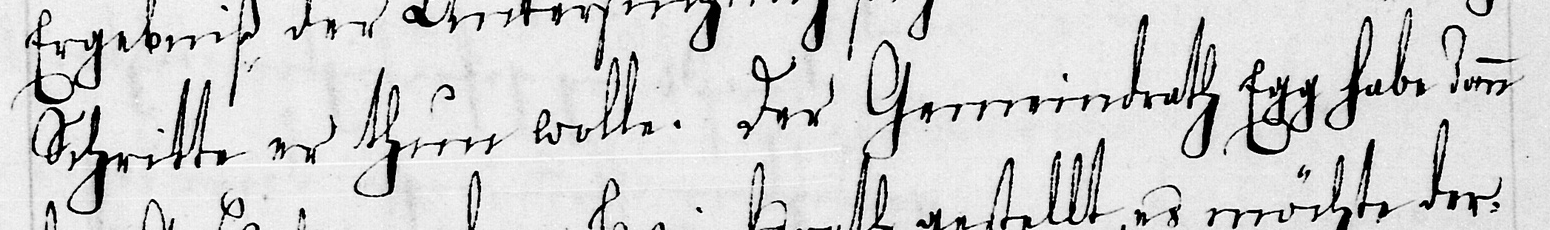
Schritte er thun wolle. Der Gemeindrath Egg habe
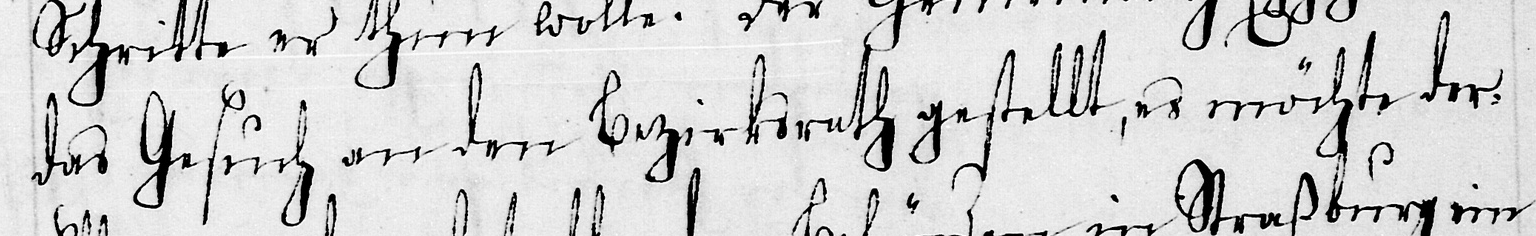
das Gesuch an den Bezirksrath gestellt, es möchte der¬
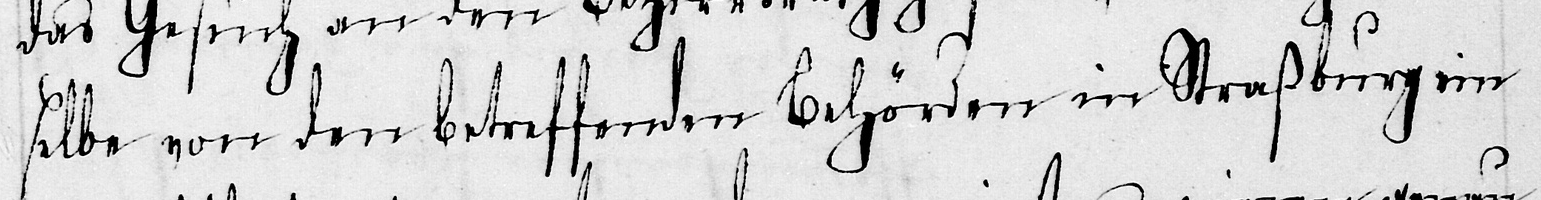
selbe von den betreffenden Behörden in Straßburg ein
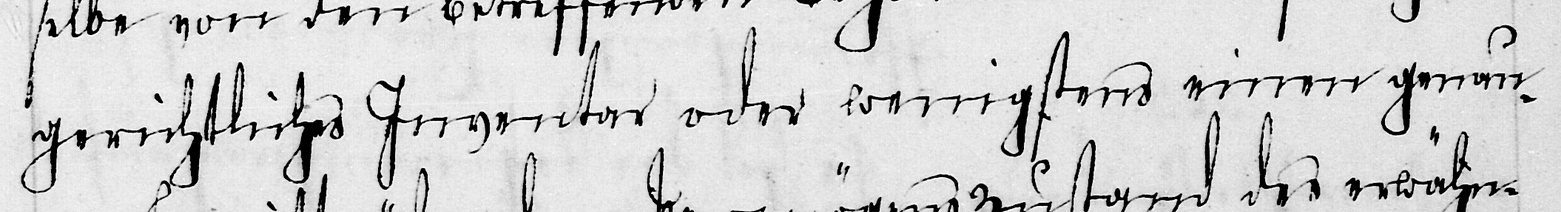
gerichtliches Inventar oder wenigstens einen genau¬
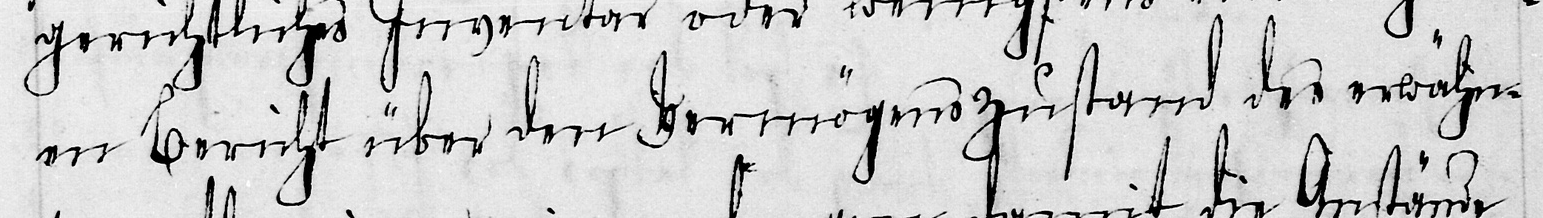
en Bericht über den Vermögenszustand des erwähn¬
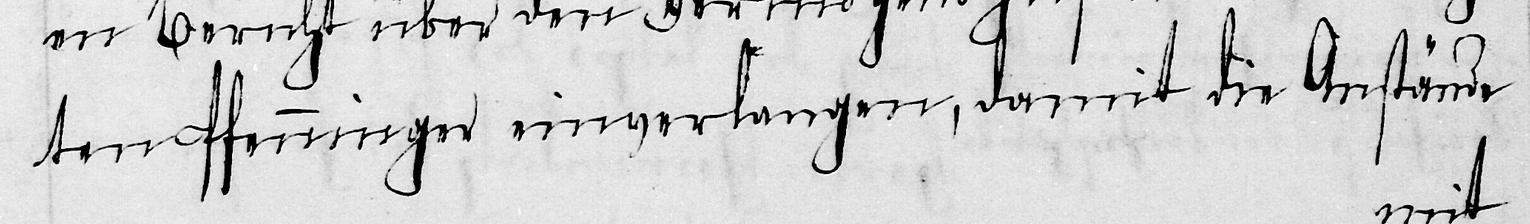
ten Pfenninger einverlangen, damit die Anstände
